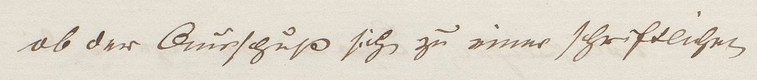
ob der Ausschuß sich zu einer schriftlichen
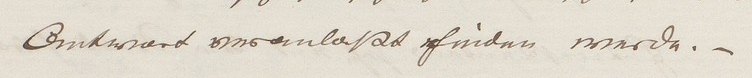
Antwort veranlaßt finden werde. –
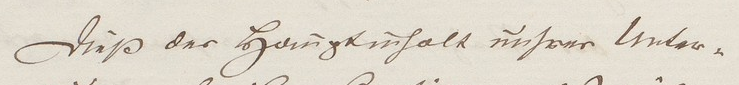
Dieß der Hauptinhalt unsrer Unter-
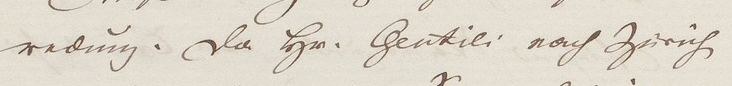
redung. Da Hr. Gentili nach Zürich
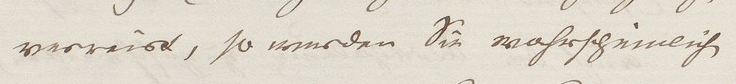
verreist, so werden Sie wahrscheinlich
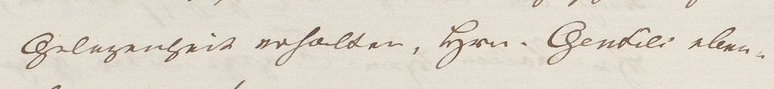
Gelegenheit erhalten, Hrn. Gentili eben-
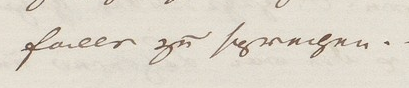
falls zu sprechen. –
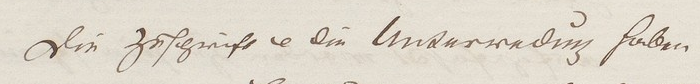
Die Zuschrift & die Unterredung haben
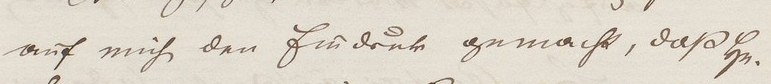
auf mich den Eindruk gemacht, daß Hr.
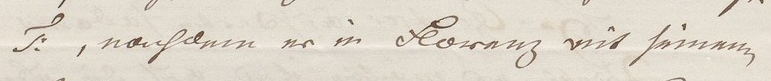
F., nachdem er in Florenz mit seinem
